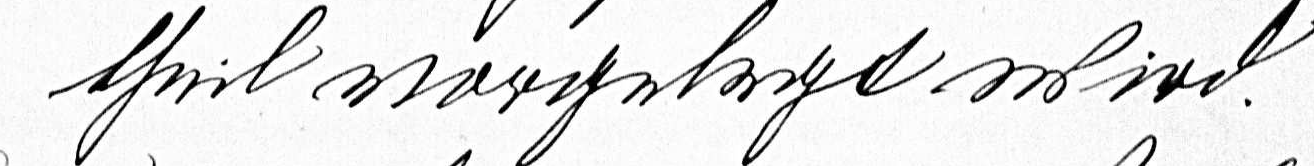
theil vorgelegt wird.
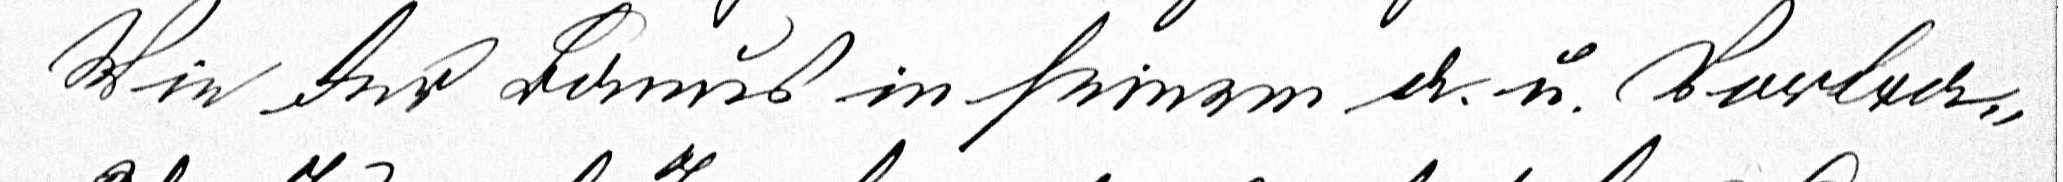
Wie der Banus in seinem a.u. Vortra¬
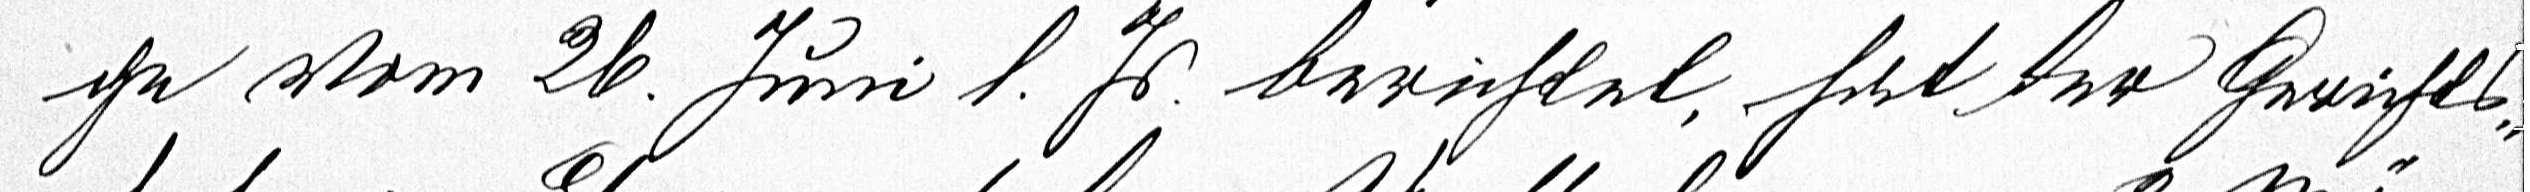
ge vom 26. Juni l. Js berichtet, hat der Gerichts¬
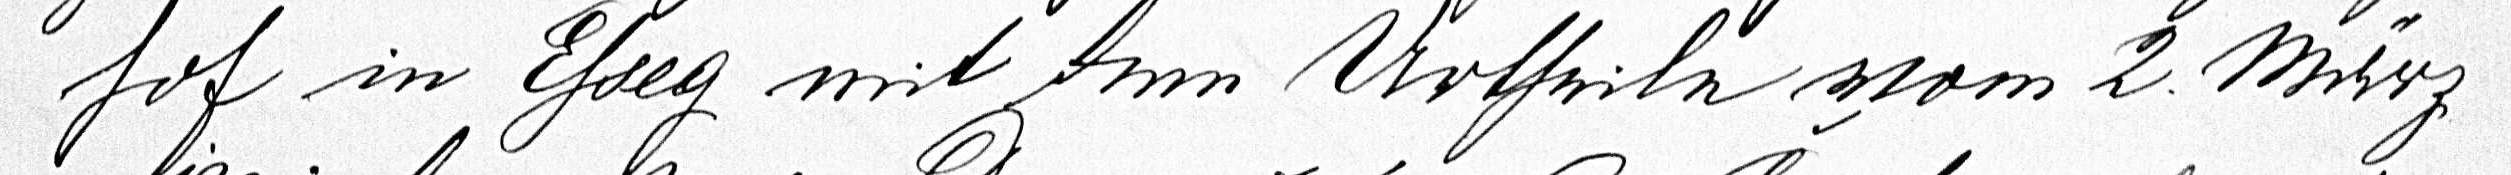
hof in Ehseg mit dem Urtheile vom 2. März
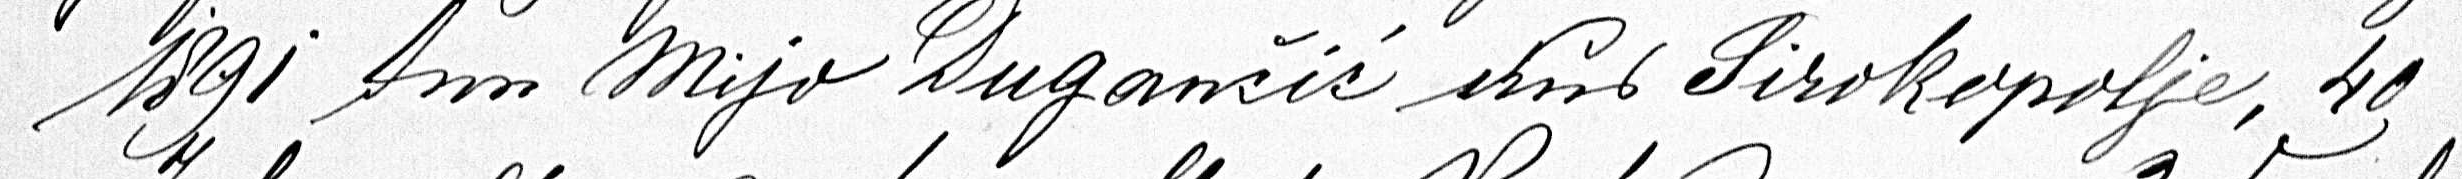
1891 den Mijo Dugančić aus Širokopolje, 40
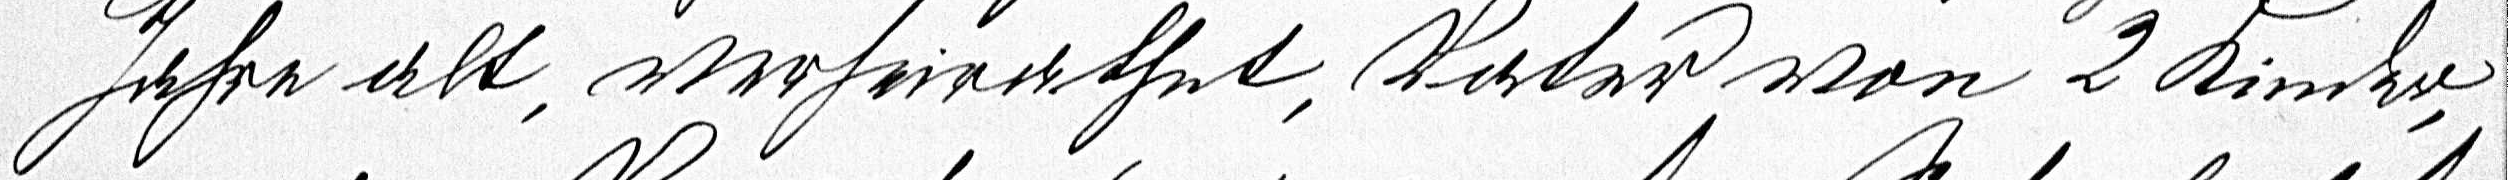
Jahre alt, verheirathet, Vater von 2 Kinder,
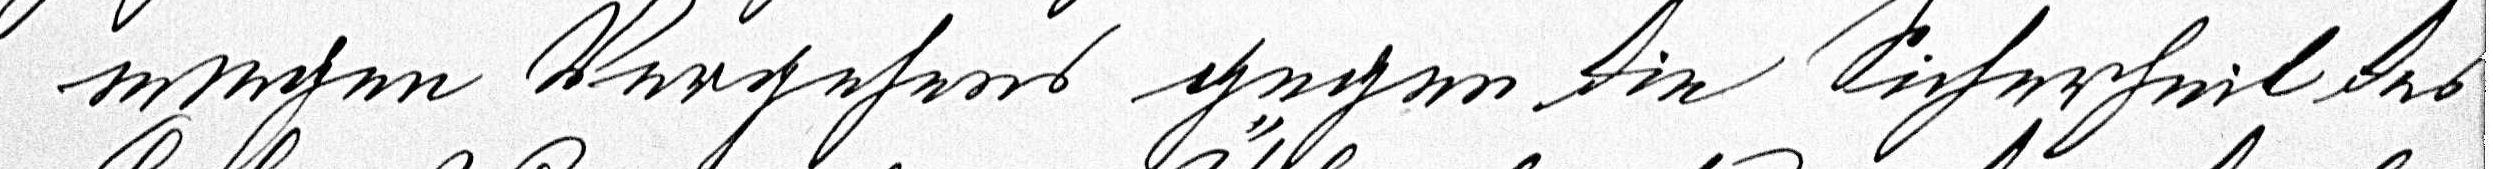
wegen Vergehens gegen die Sicherheit des
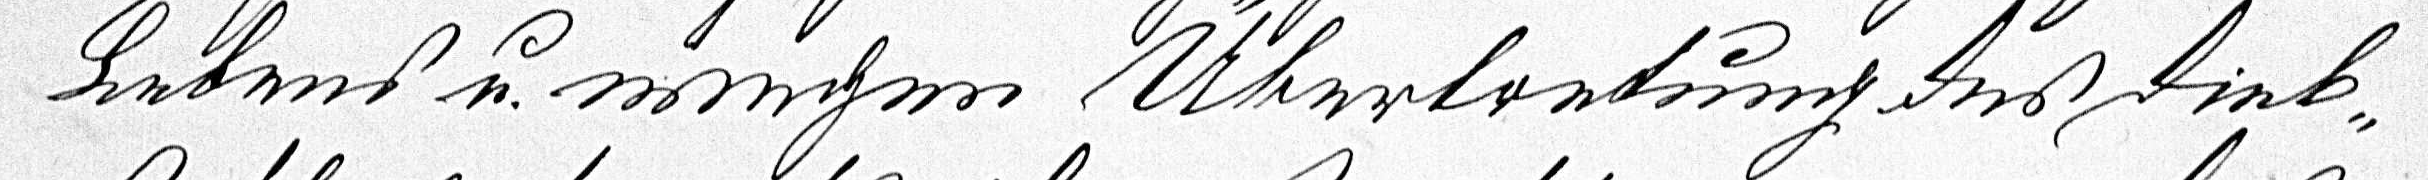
Lebens u. wegen Übertretung des dieb¬
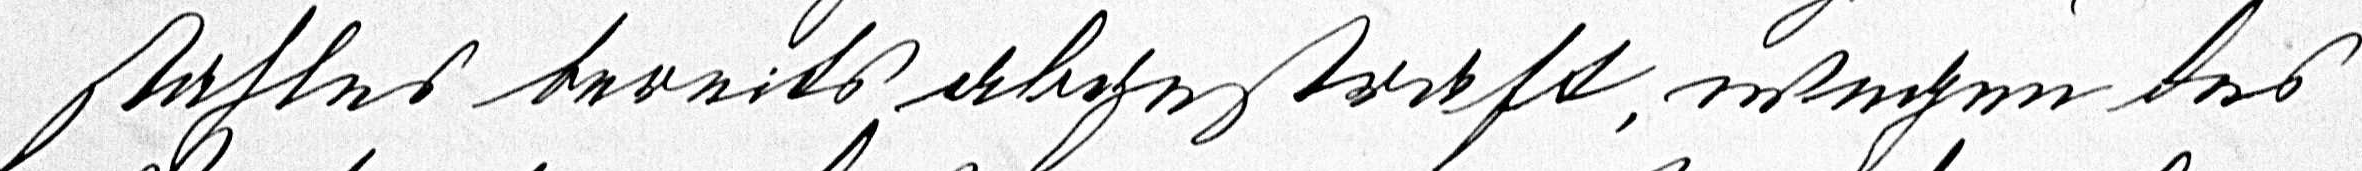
stahles bereits abgestraft, wegen des
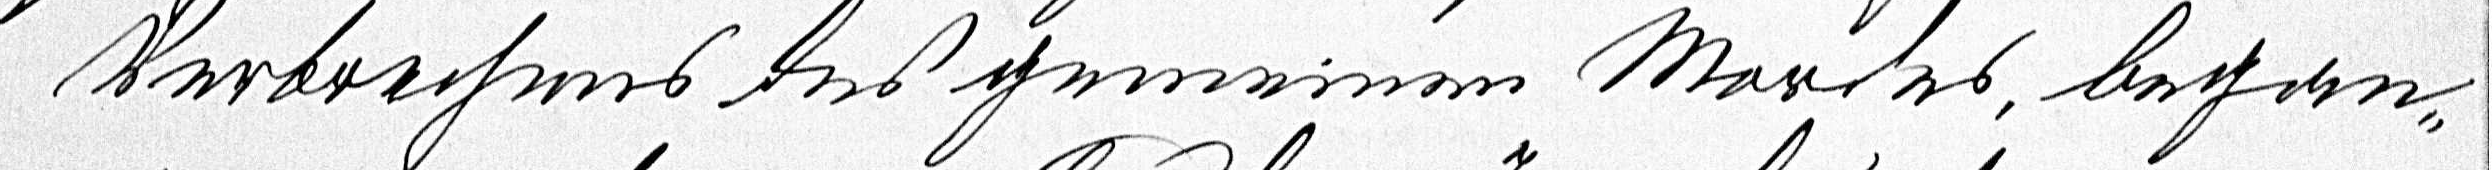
Verbrechens des gemeinen Mordes, began¬
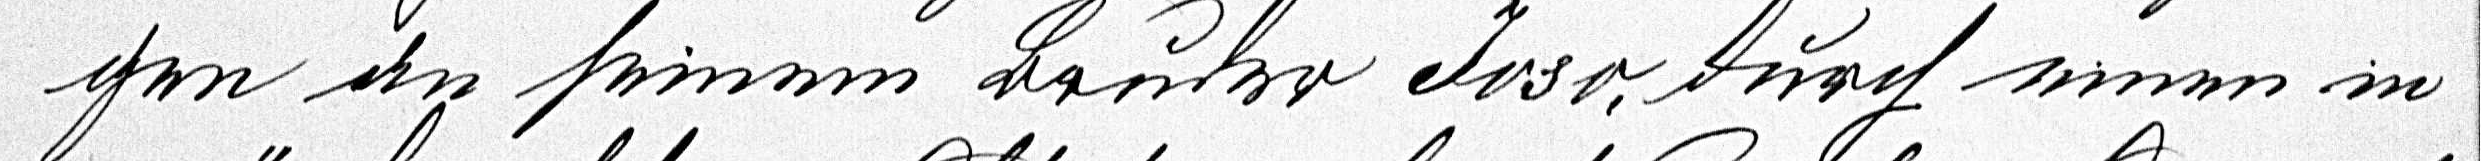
gen an seinem Bruder Joso, durch einen in
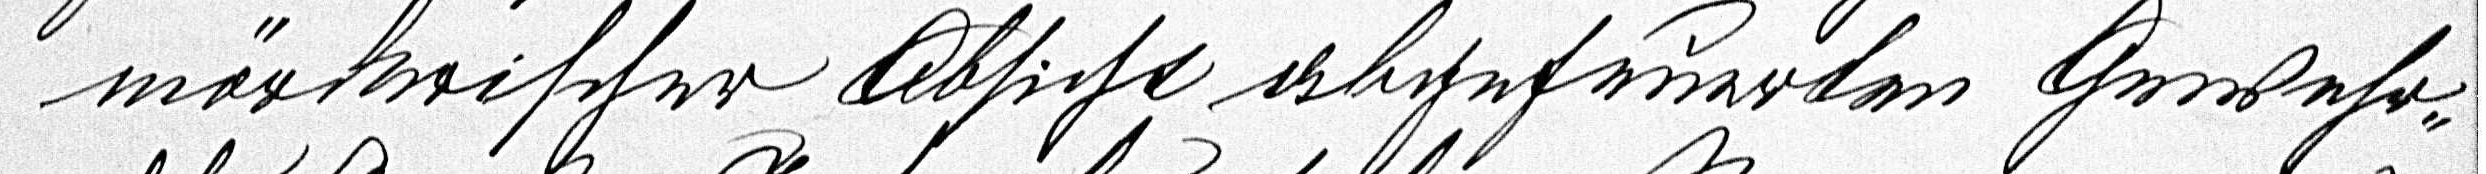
mörderischer Absicht abgefeuerten Gewehr¬
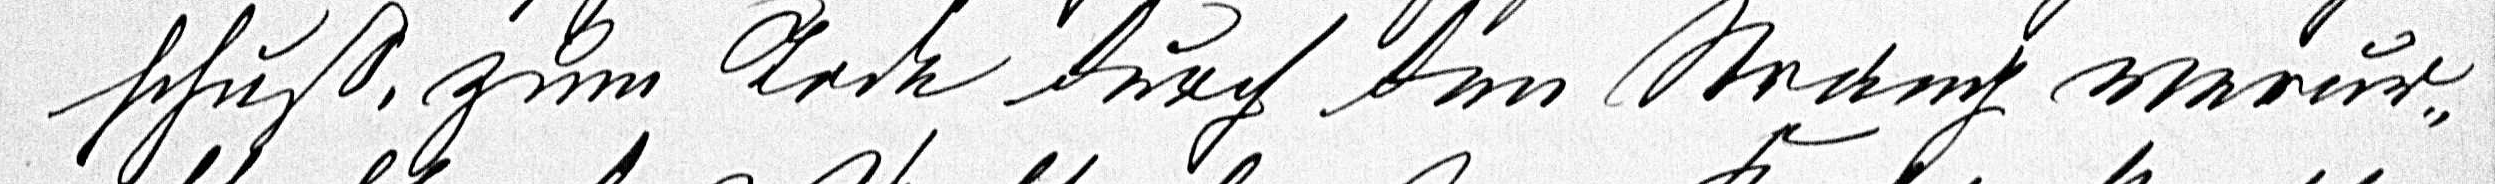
schuß, zum Tode durch den Strang verur¬
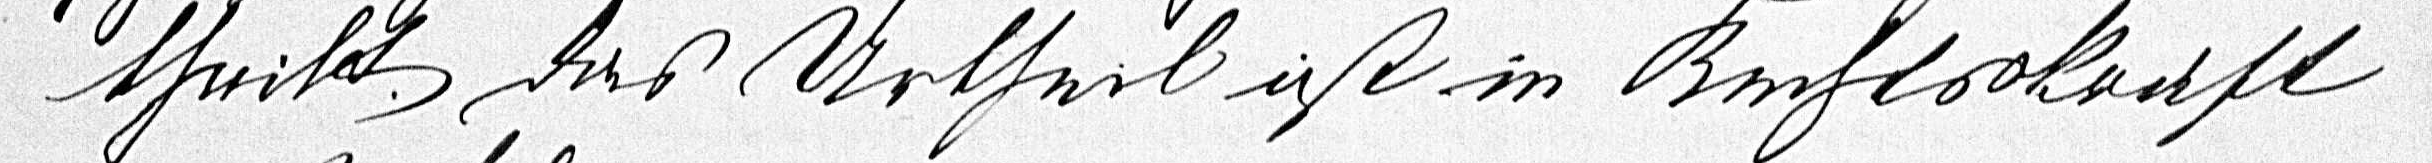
theit. Das Urtheil ist in Rechtskraft
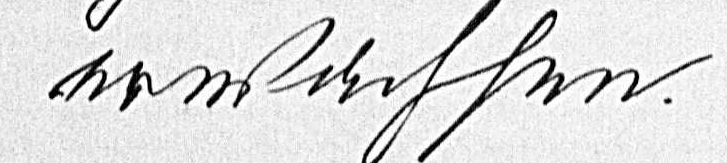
erwachsen.
